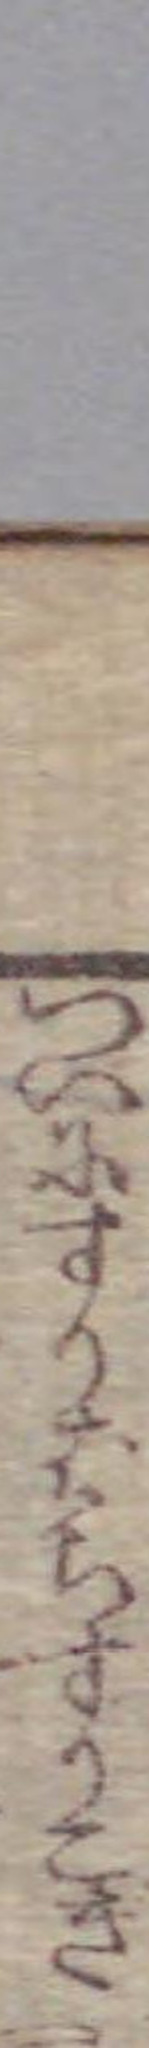ついにすりばちすりこぎ
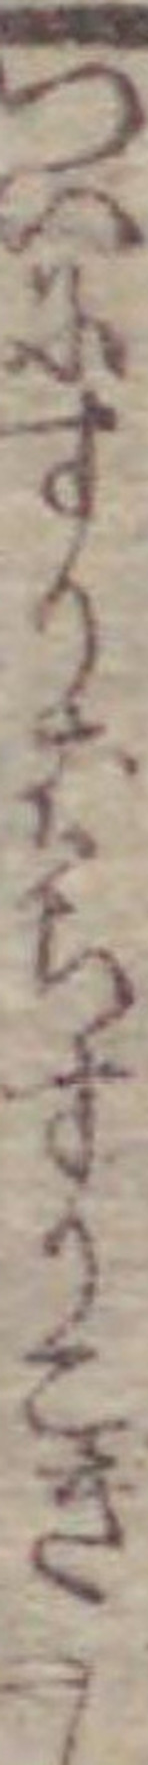ついにすりばちすりこぎ
